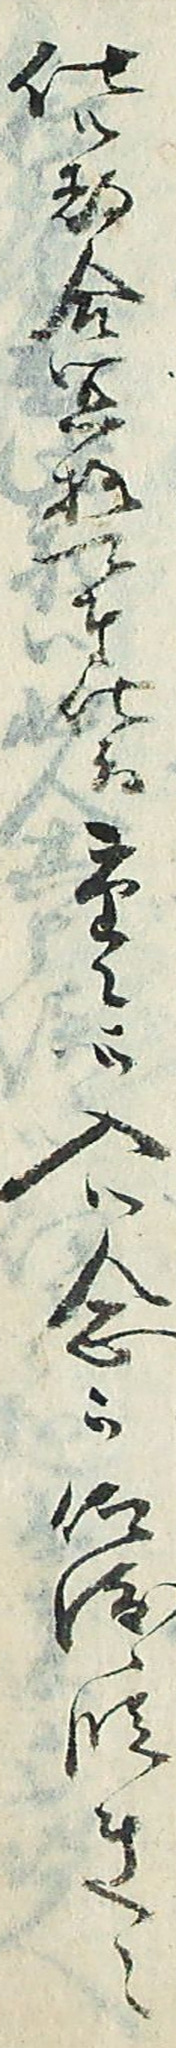仕御都合宜様可奉仕旨重々被入御念被仰渡候段
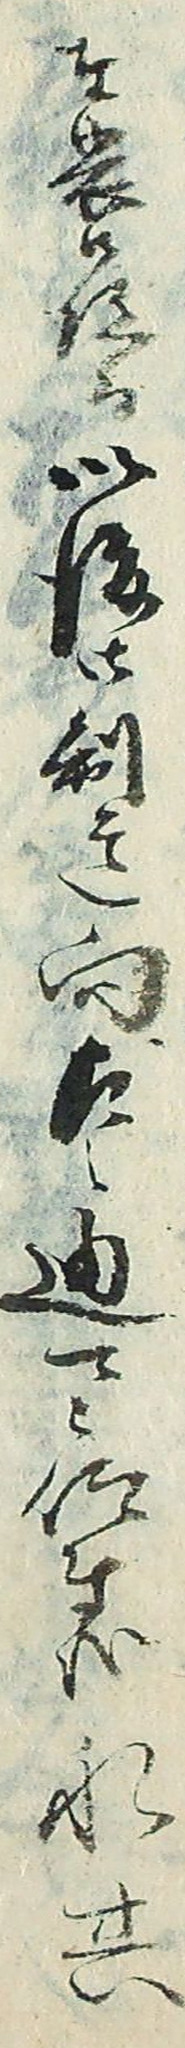奉畏候随而以後御制道向左之通可被仰付哉私共
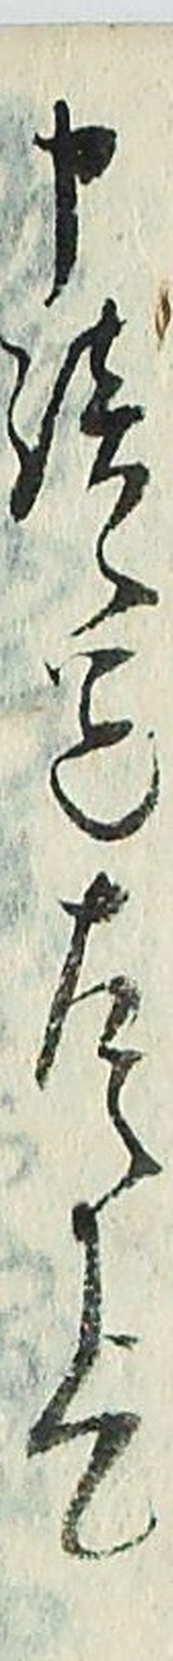申談候運左へ申上候
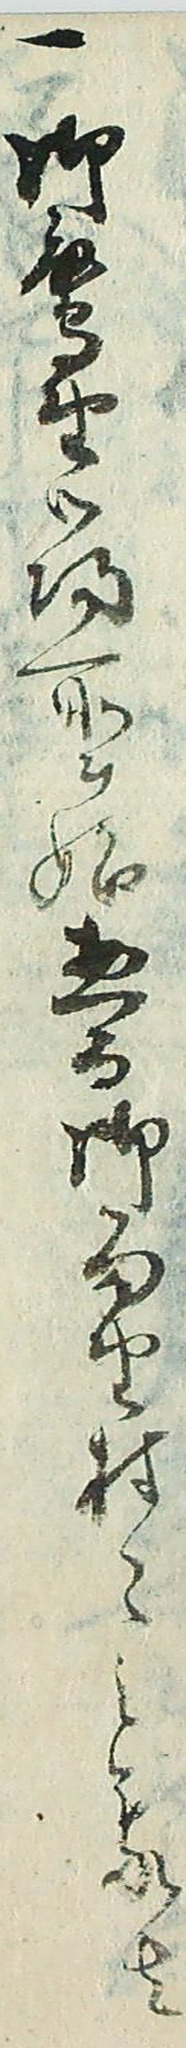一御鷹野御場所を始惣而御留野村々之義は
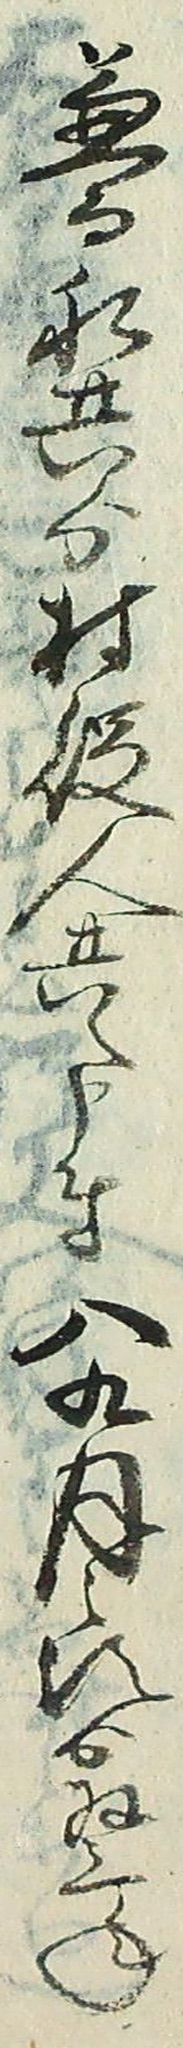兼而私共ゟ村役人共へ申付八九月之頃ゟ翌年
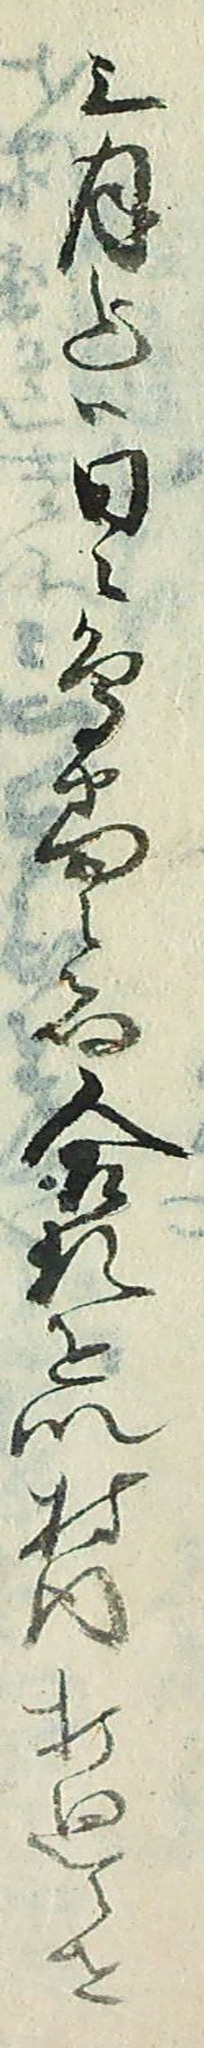三月迄は日々鳥番之者合札を以村内打廻らせ
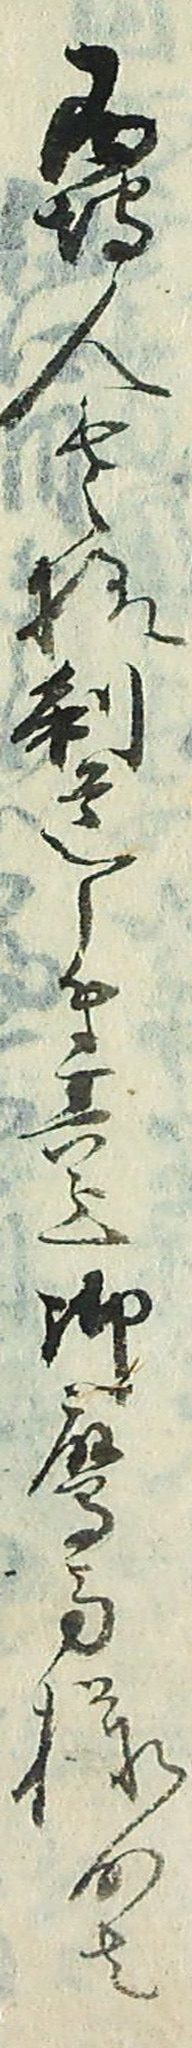不埒人無之様制道申付其上御鷹方様ゟは
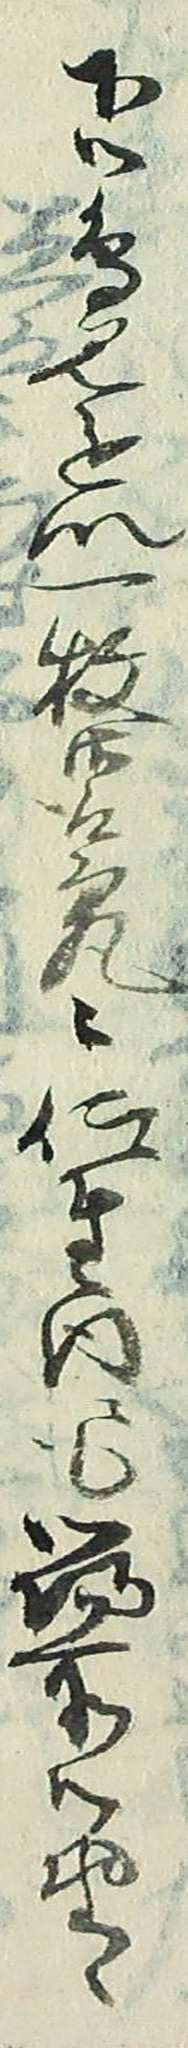下御鳥見を以一牧御取究被仰付候内にも御場所御坐候
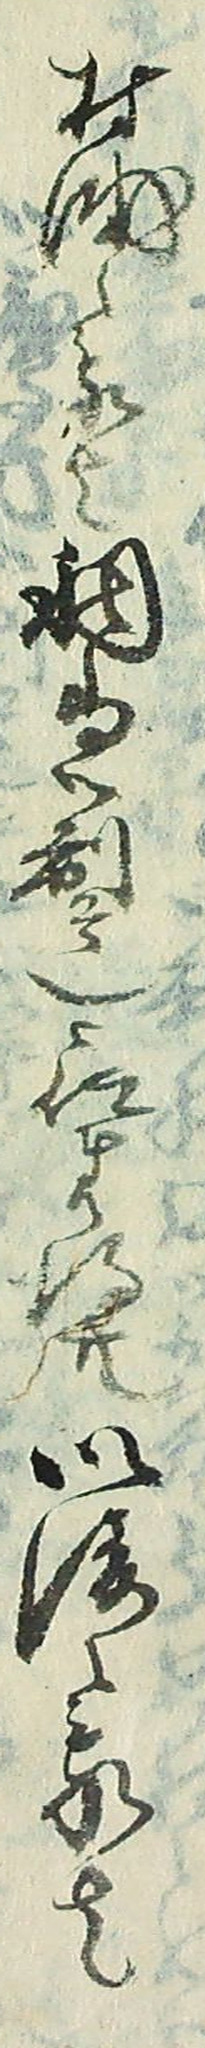村浦之義は稠布御制道被仰付候得共以後之義は
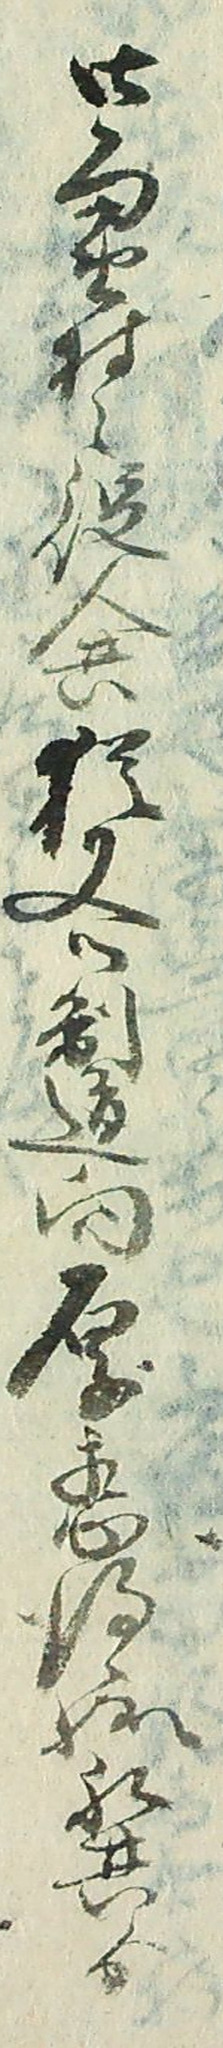御留野村之役人共猶又御制道向厚相心得候様私共ゟ
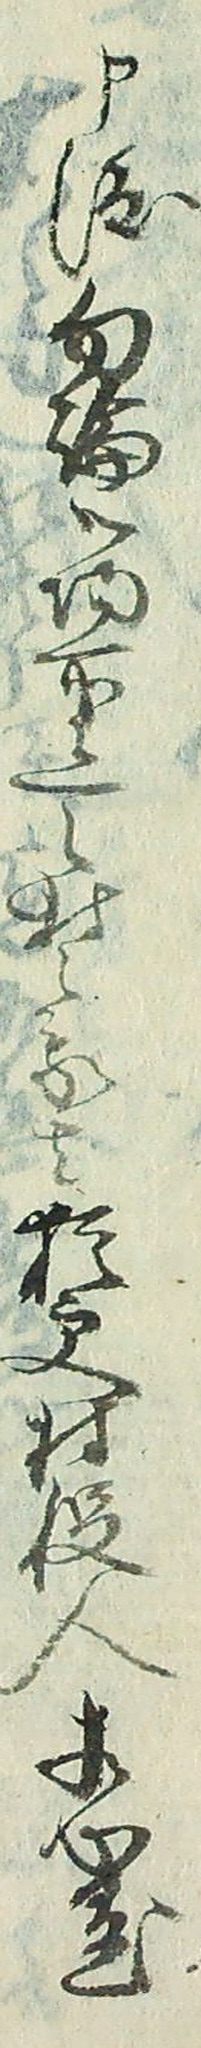申渡勿論御場所有之村之義は猶更村役人相心懸
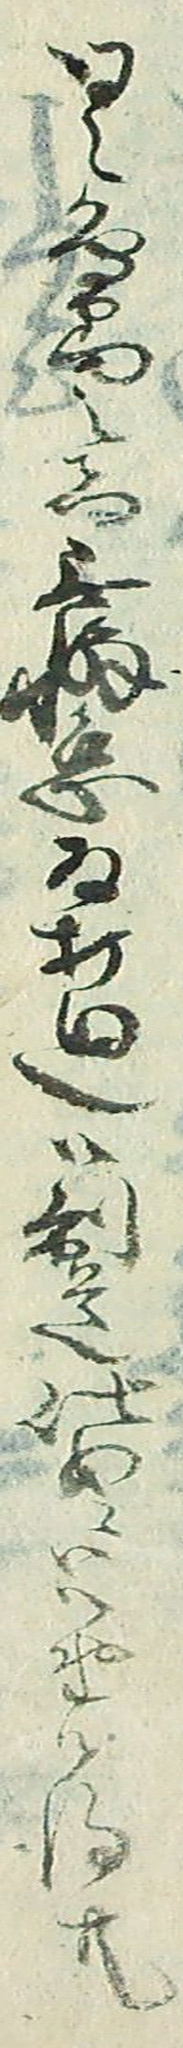日々鳥番之者無懈怠為打廻御制道仕義には御坐候得共
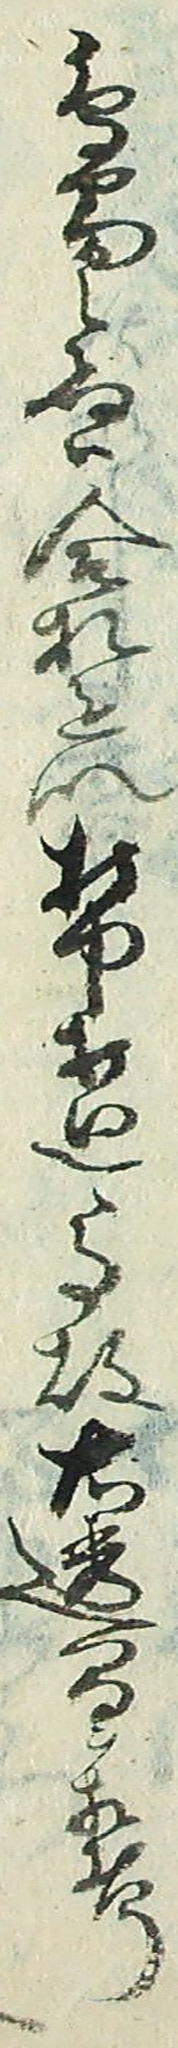鳥番之者は合札を以村中打廻候事故右透間を相考
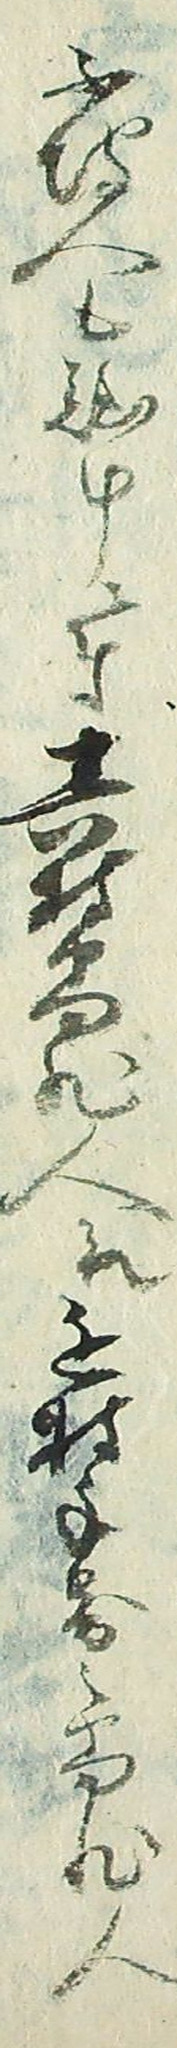不埒人も難計に付其村番非人江近村手寄之番非人
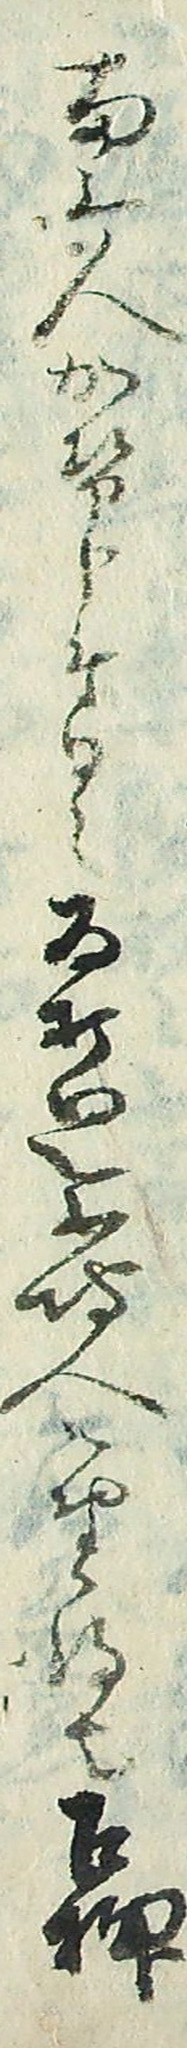両三人加勢申付日々為打廻不埒人御坐候得者召捕
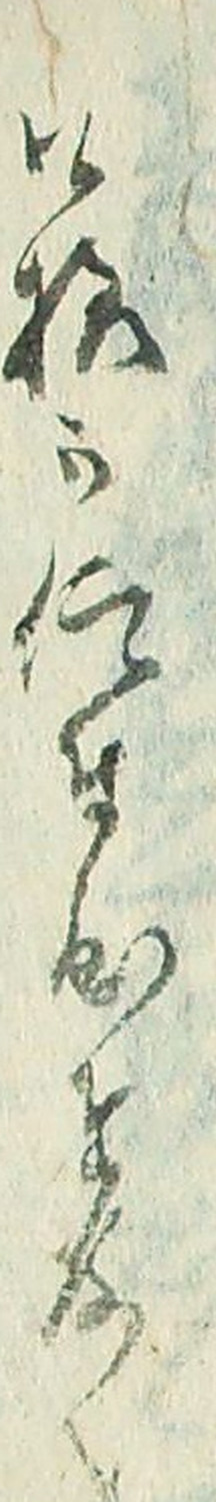候様被仰付度奉存候
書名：諸御用御□受書控
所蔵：鳴門教育大学 Naruto University of Education
